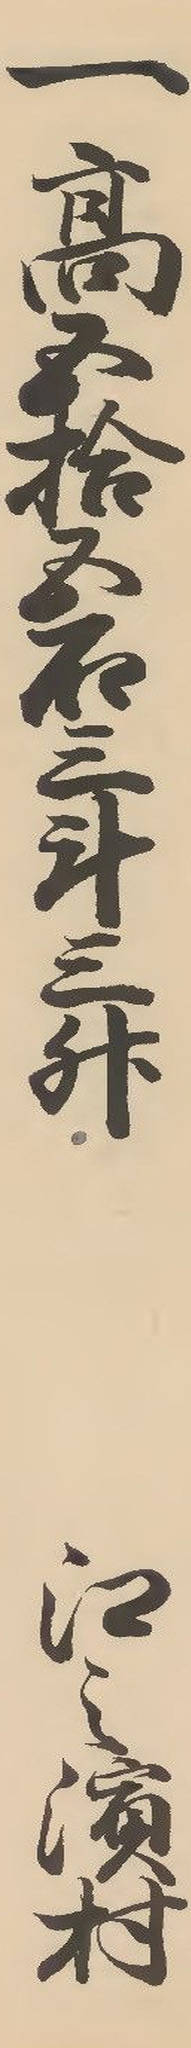一髙五拾五石三斗三升江之濱村
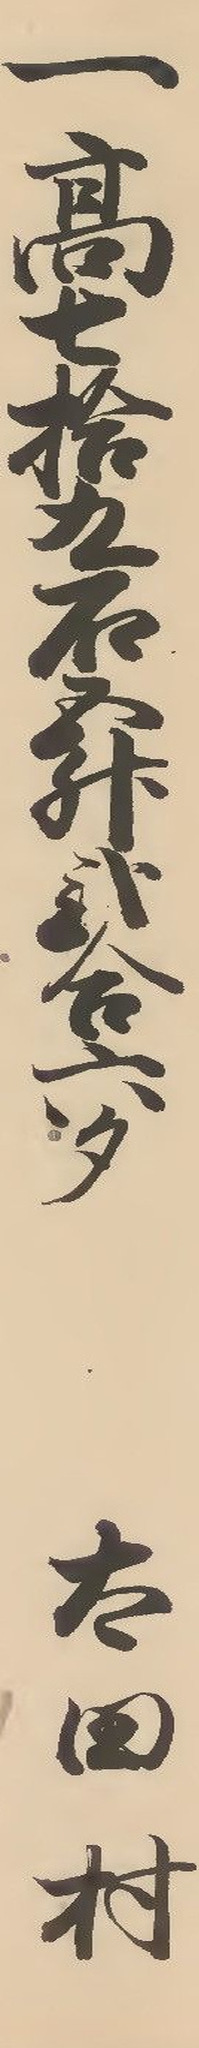一髙七拾九石五升弐合六夕太田村
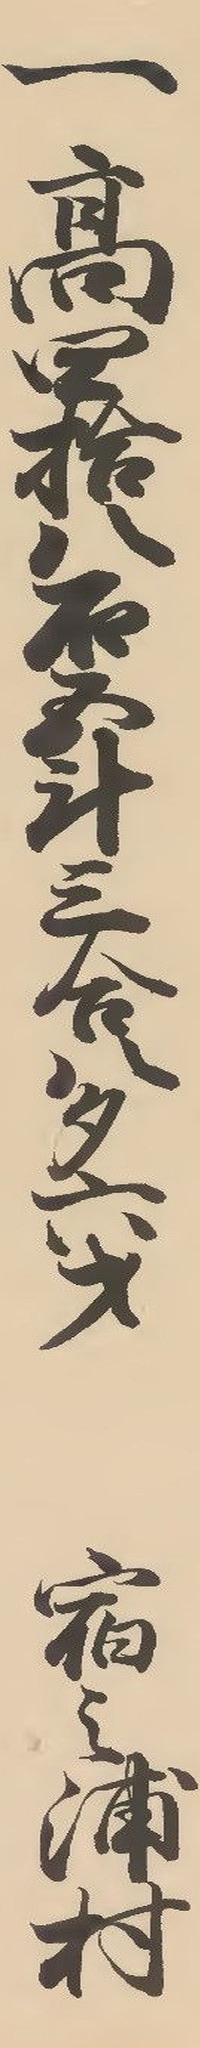一髙四拾八石五斗三合八夕六才宿之浦村
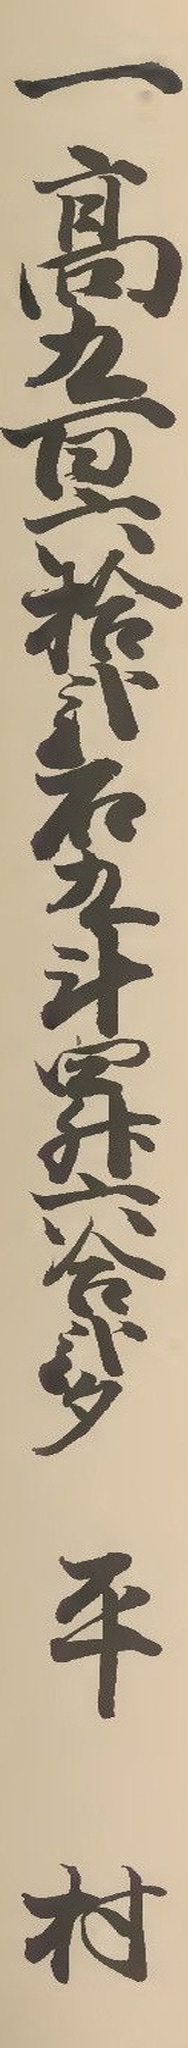一髙九百六拾弐石九斗四升六合弐夕平村
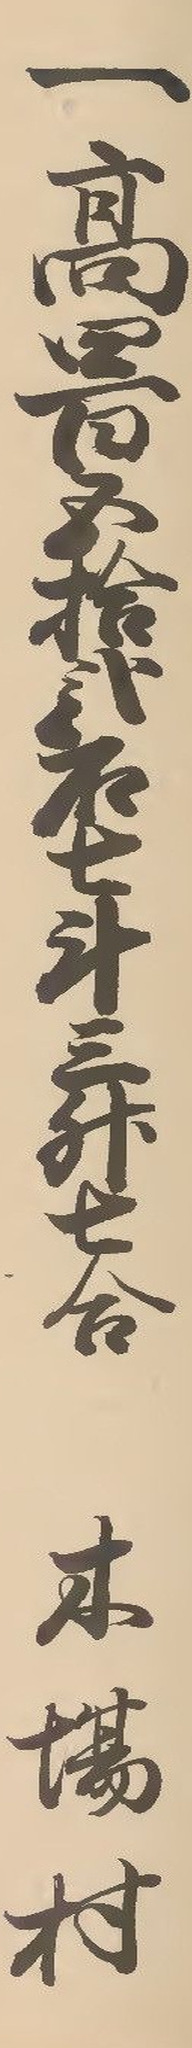一髙四百五拾弐石七斗三升七合木場村
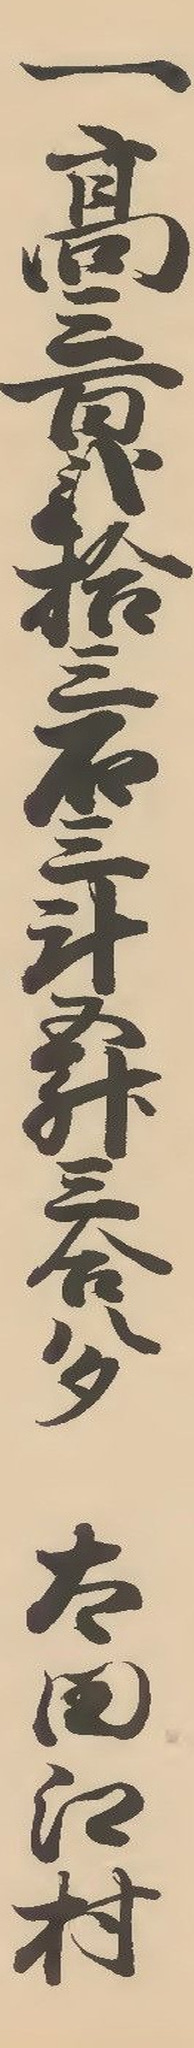一髙三百弐拾三石三斗五升三合八夕太田江村
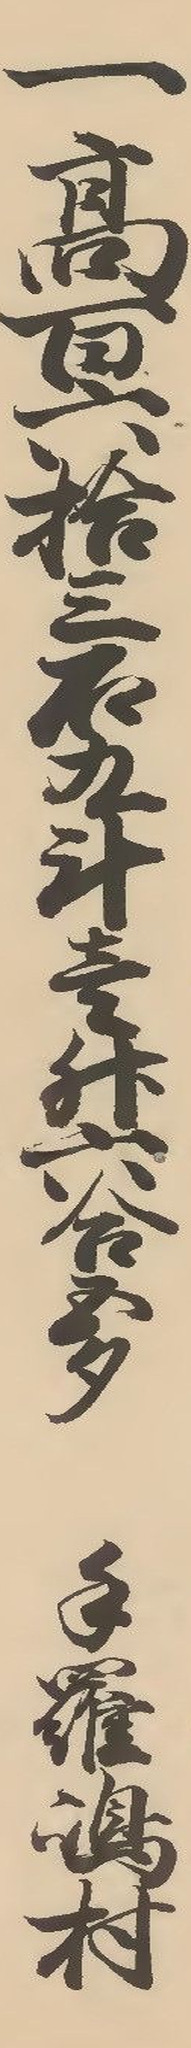一髙百六拾三石九斗壱升六合五夕手羅嶋村
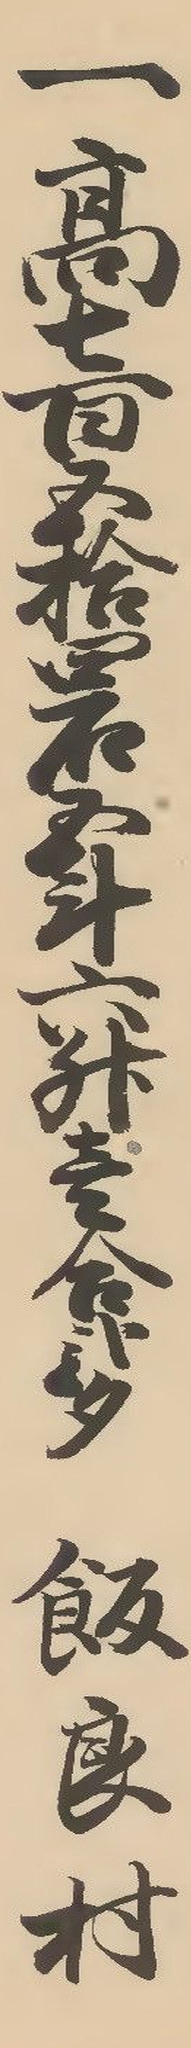一髙七百五拾四石五斗六升壱合弐夕飯良村

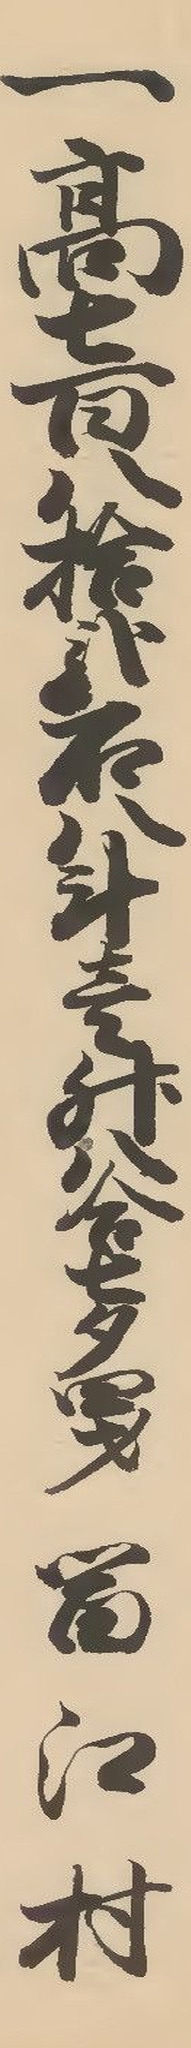一髙七百八拾弐石八斗壱升八合七夕四才
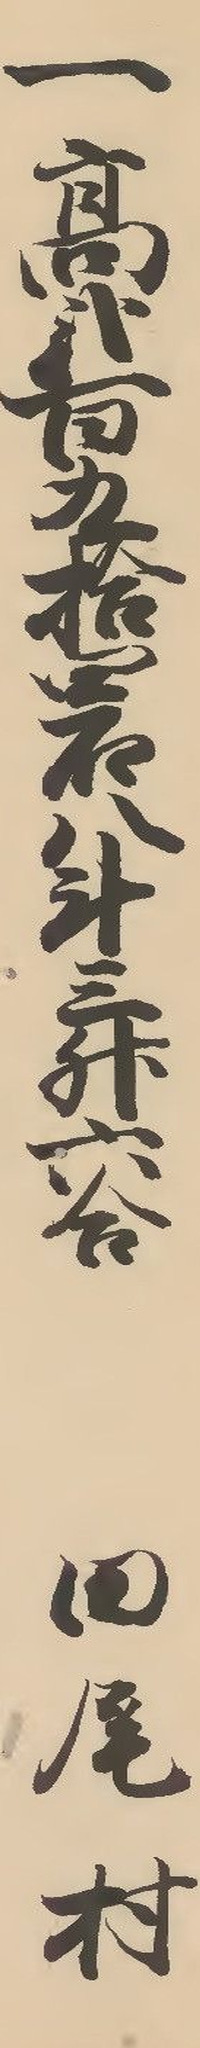一髙弐百九拾四石八斗三升六合田尾村
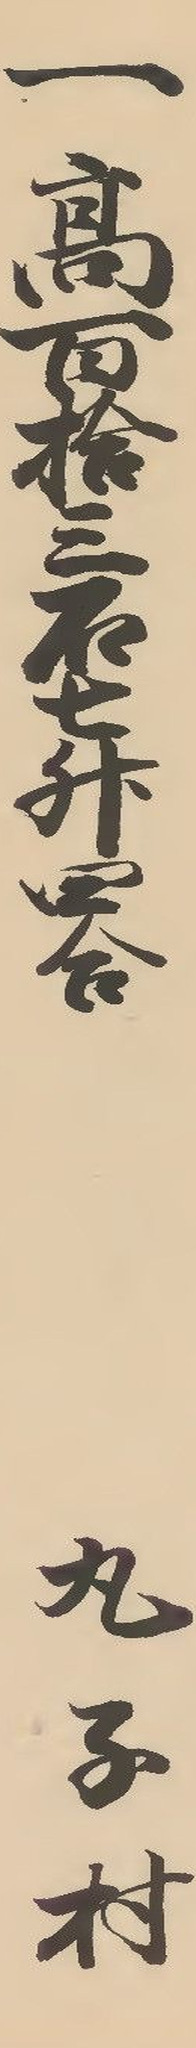一髙百拾三石七升四合丸子村
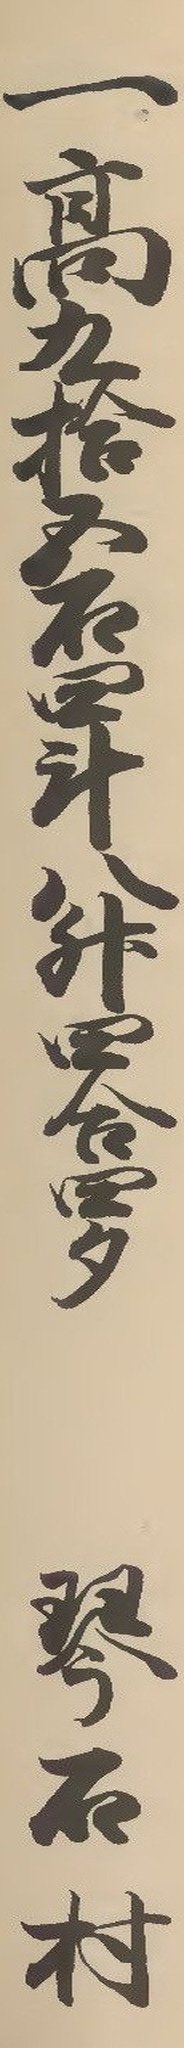一髙九拾五石四斗八升四合四夕琴石村
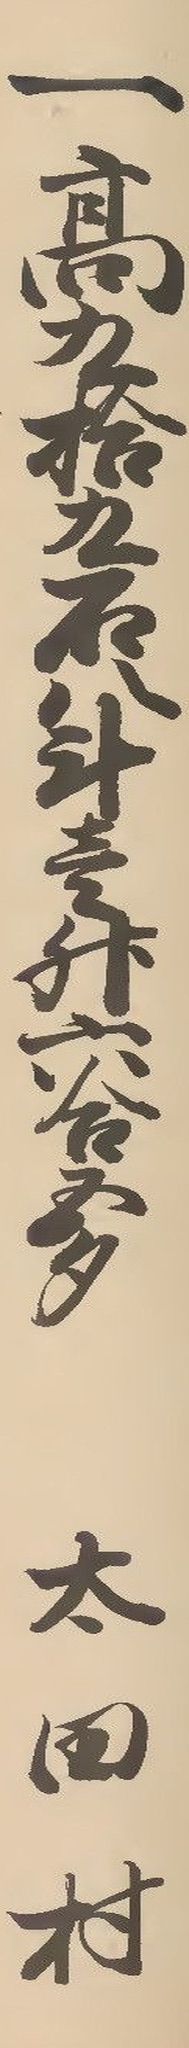一髙九拾九石八斗壱升六合五夕太田村
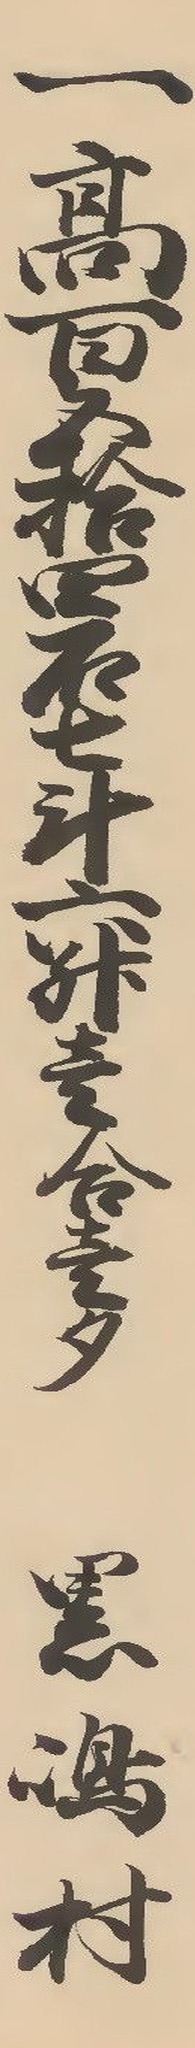一髙百五拾四石七斗六升壱号壱黒嶋村

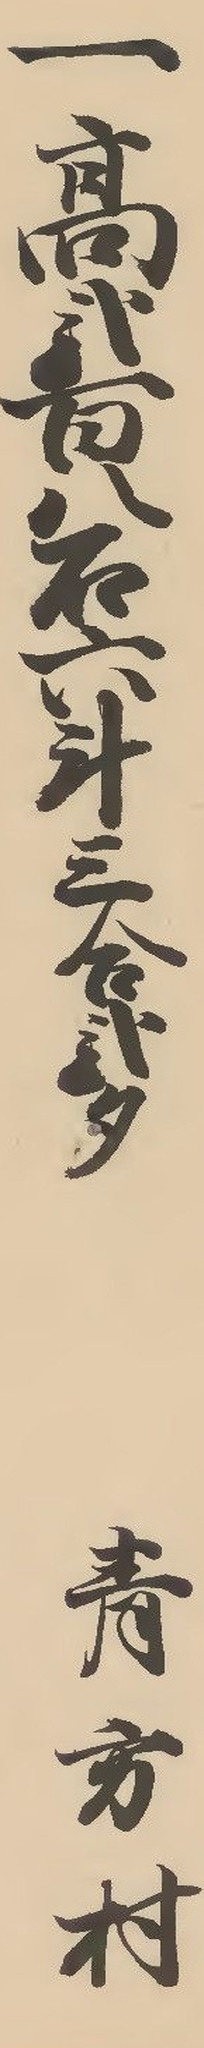一髙弐百八石六斗三合弐夕青方村
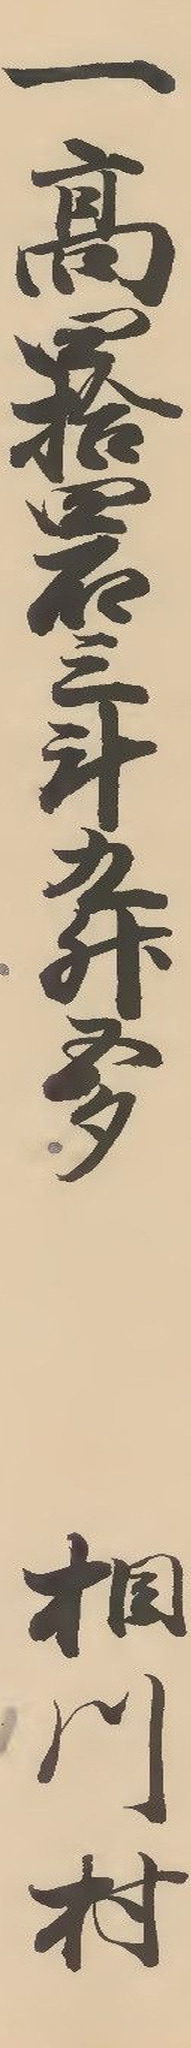一髙四拾四石三斗九升五夕相川村
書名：肥前国郷帳
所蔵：国立公文書館 National Archives of Japan
